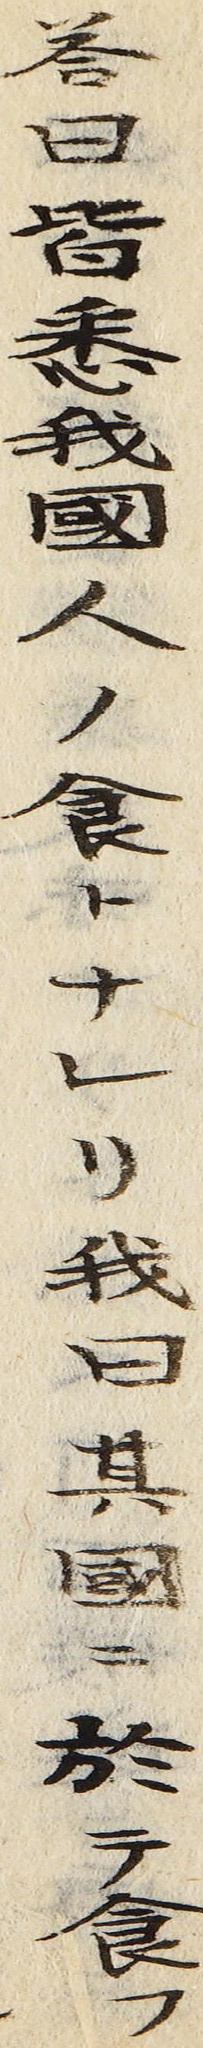答曰皆悉我国人ノ食トナレリ我曰其国ニ於テ食フ
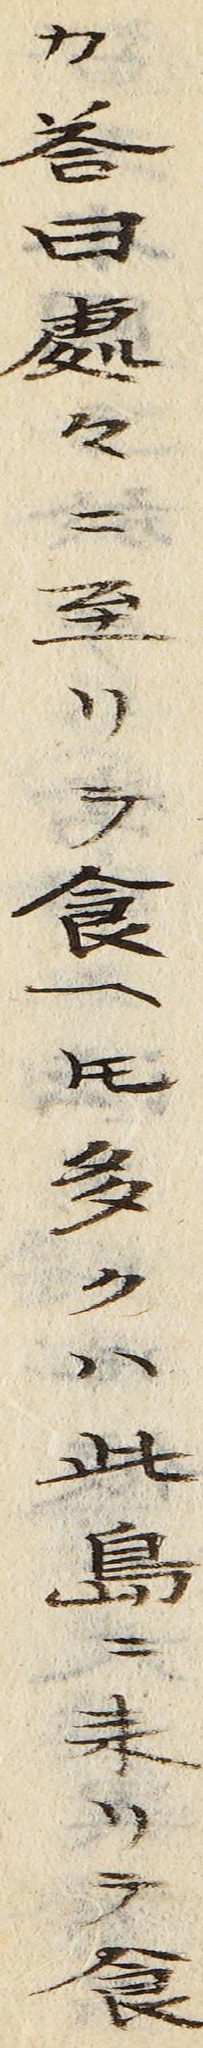カ答曰処々ニ至リテ食ヘトモ多クハ此島ニ来リテ食
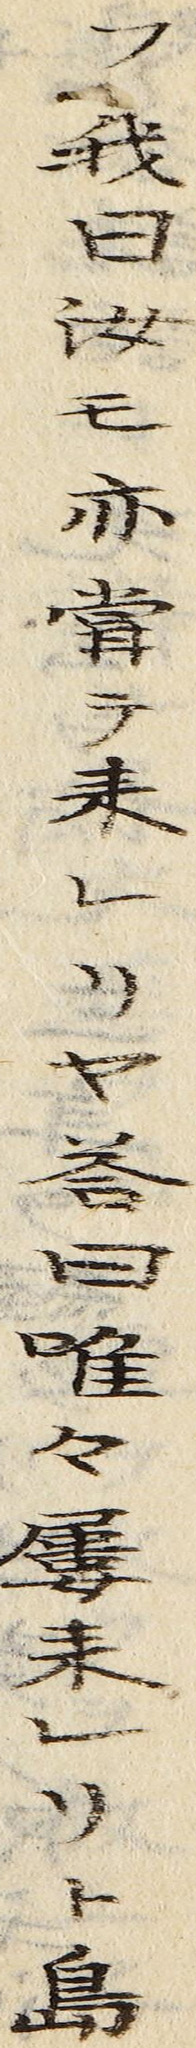フ我曰汝モ亦嘗テ来レリヤ答曰唯々屡来レリト島
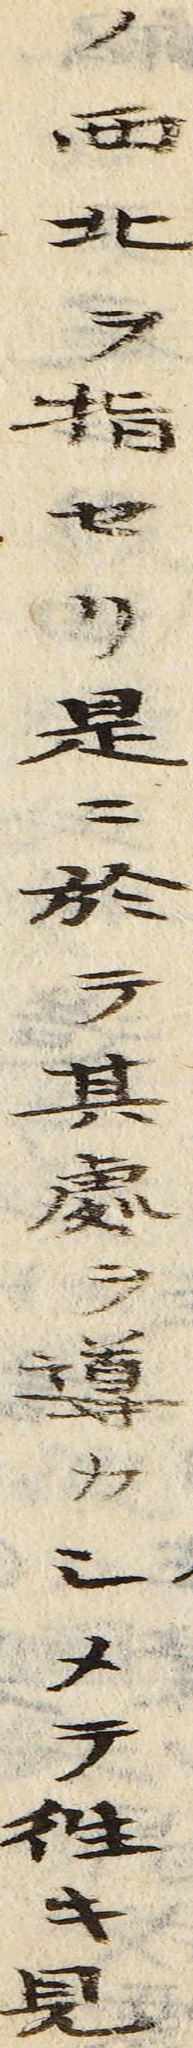ノ西北ヲ指セリ是ニ於テ其処ヲ導カシメテ往キ見
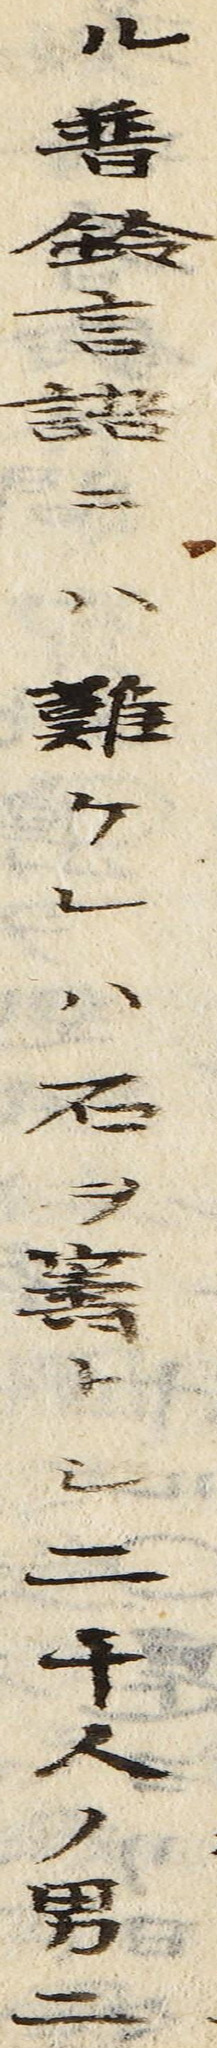ル普鈴言語ニハ難ケレハ石ヲ籌トシ二十人ノ男二
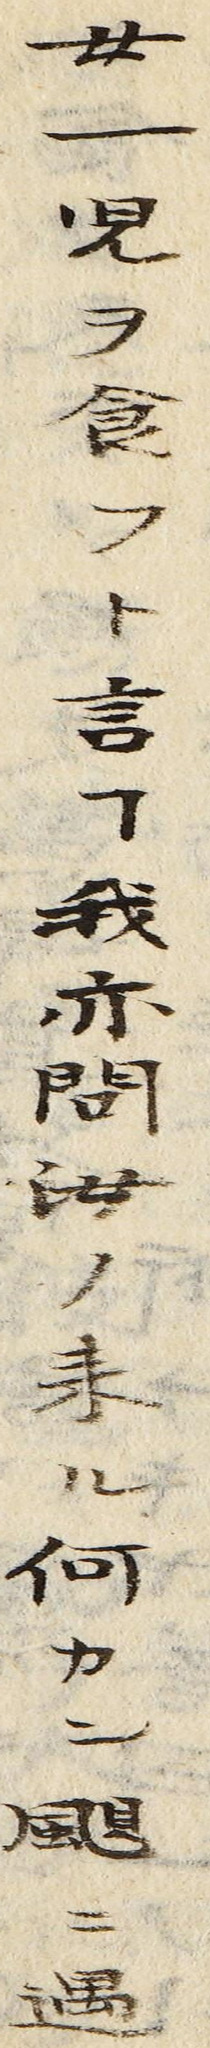女一児ヲ食フト言コト我亦問汝ノ来ル何カン颶ニ遇
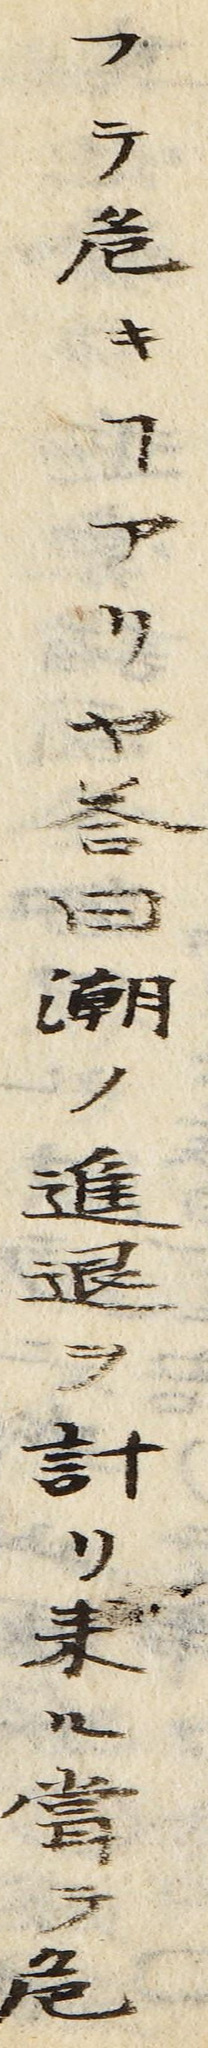フテ危キコトアリヤ答曰潮ノ進退ヲ計リ来ル嘗テ危
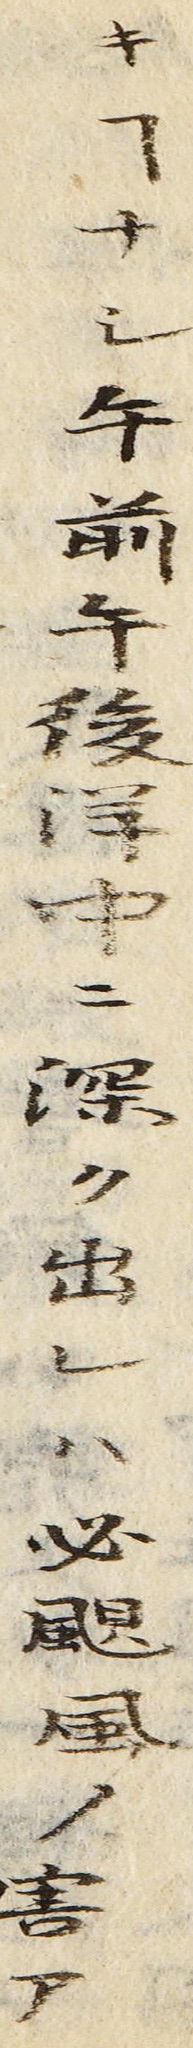キコトナシ午前午後洋中ニ深ク出レハ必颶風ノ害ア
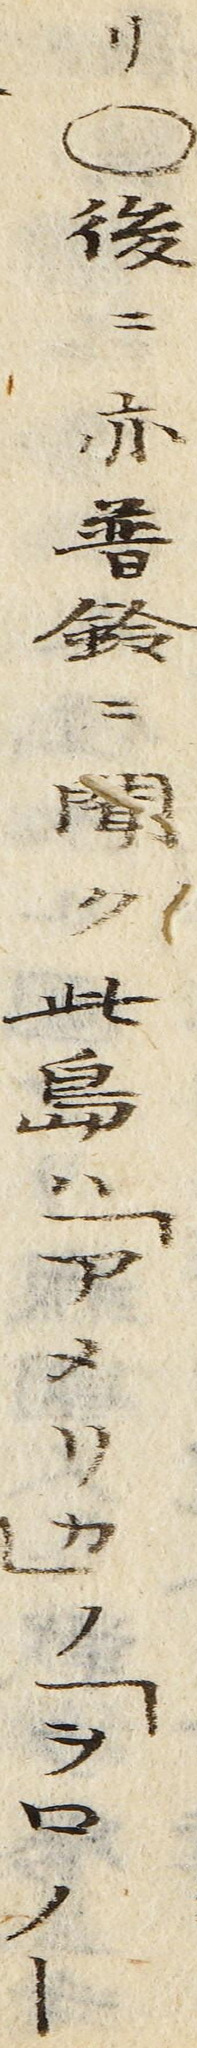リ◯後ニ亦普鈴ニ聞ク此島ハ「アメリカ」ノ「ヲロノー
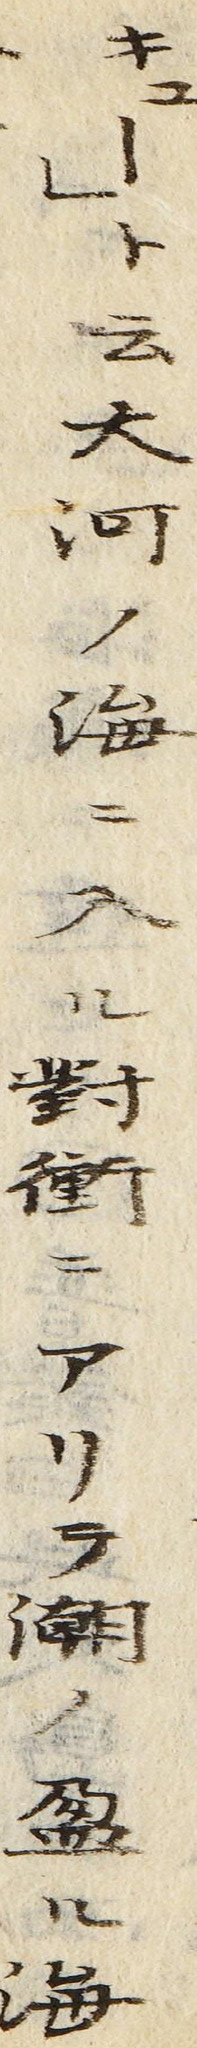キュー」ト云大河ノ海ニ入ル対衝ニアリテ潮ノ盈ル海
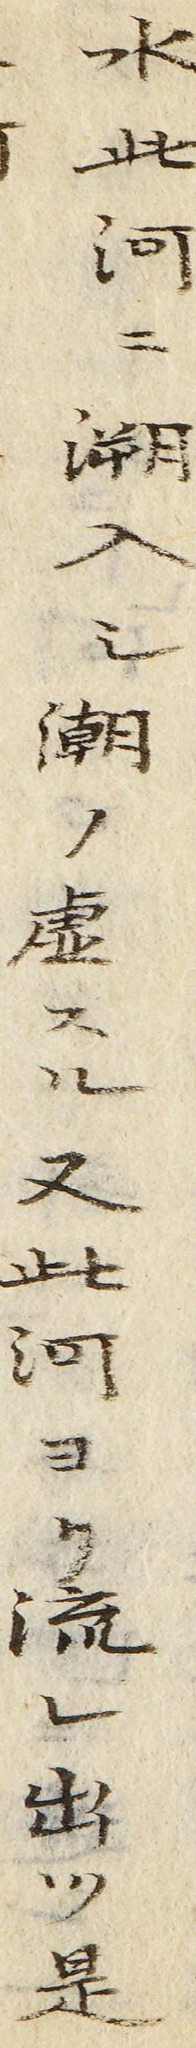水此河ニ溯入シ潮ノ虚スル又此河ヨリ流レ出ツ是
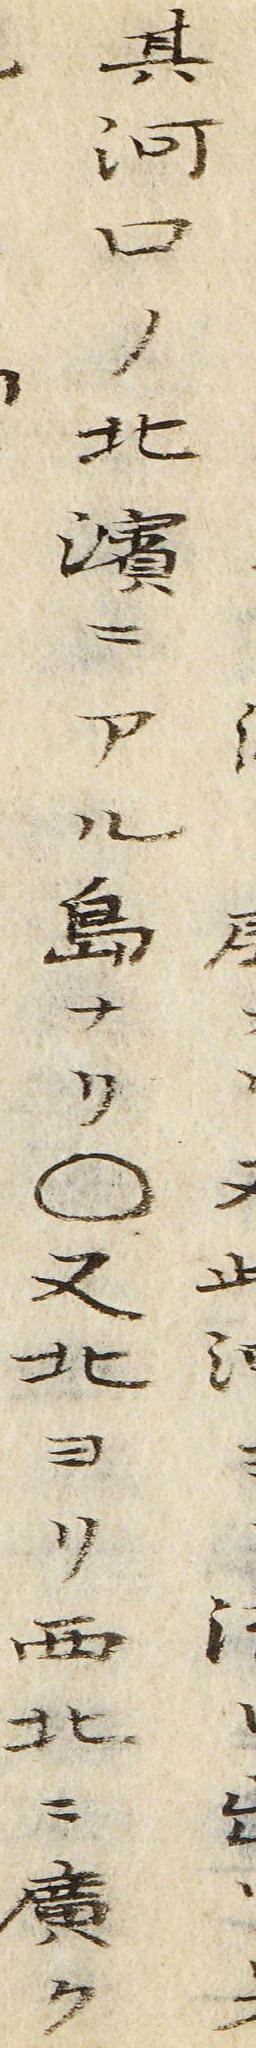其河口ノ北浜ニアル島ナリ◯又北ヨリ西北ニ広ク
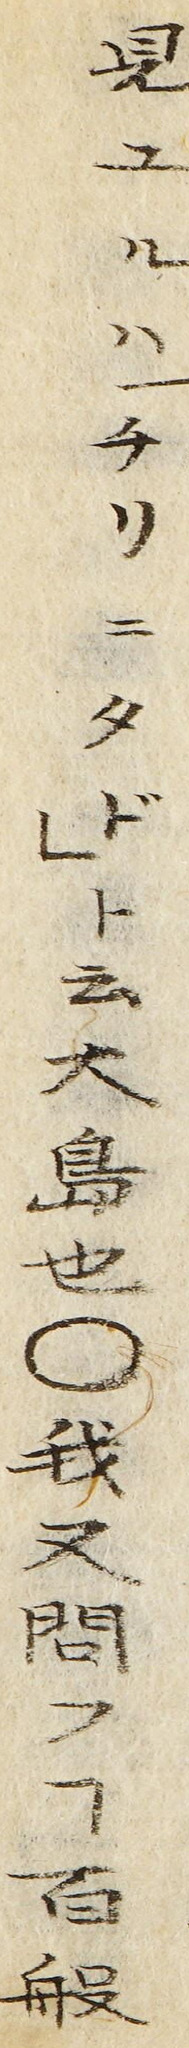見ユルハ「チリニタド」ト云大島也◯我又問フコト百般

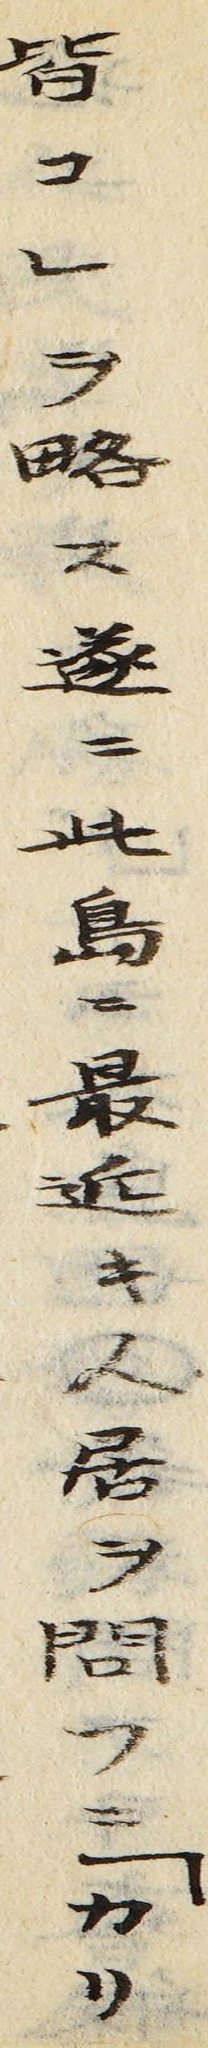皆コレヲ略ス遂ニ此島ニ最近キ人居ヲ問フニ「カリ
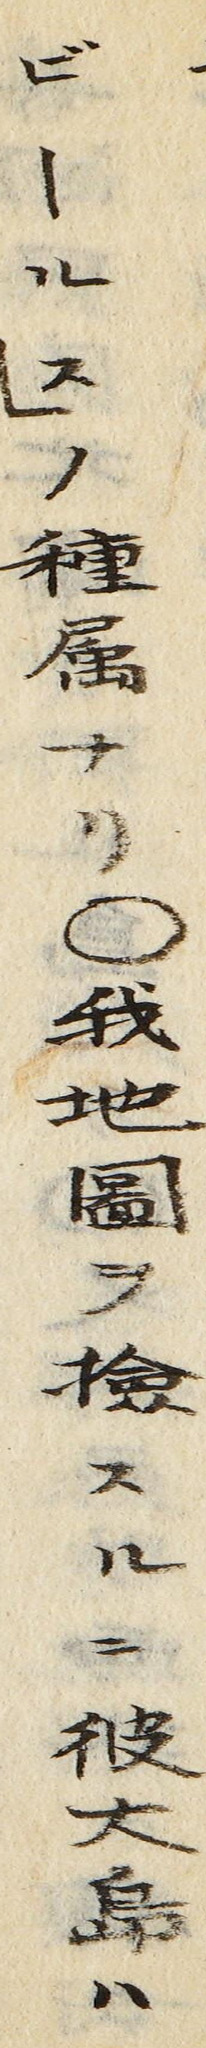ビールス」ノ種属ナリ◯我地図ヲ撿スルニ彼大島ハ
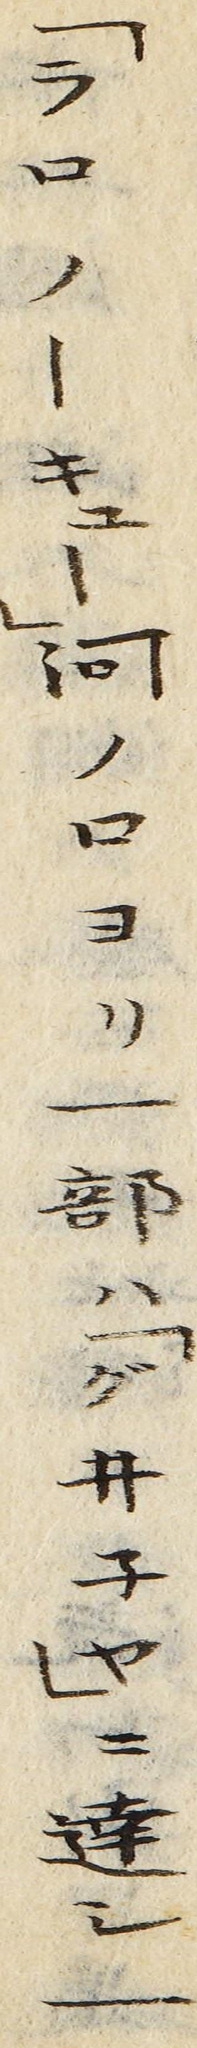「ラロノーキュー」河ノ口ヨリ一部ハ「グヰネヤ」ニ達シ一
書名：漂流紀事
